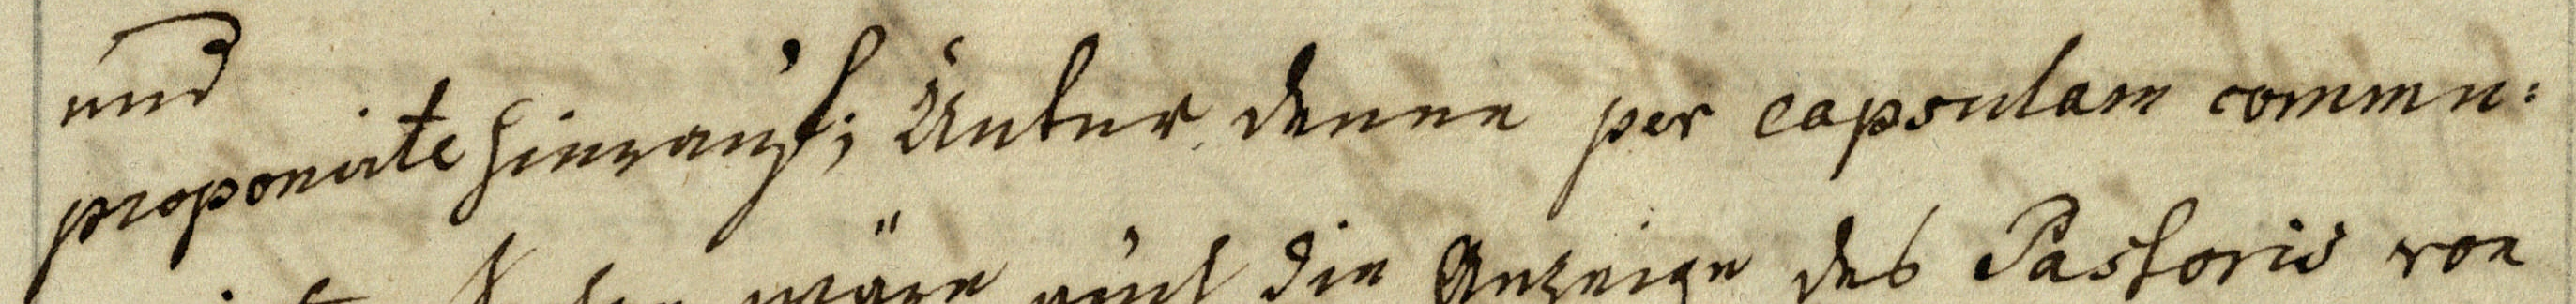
proponirte hierauf; Unter denen per capsulam commu¬
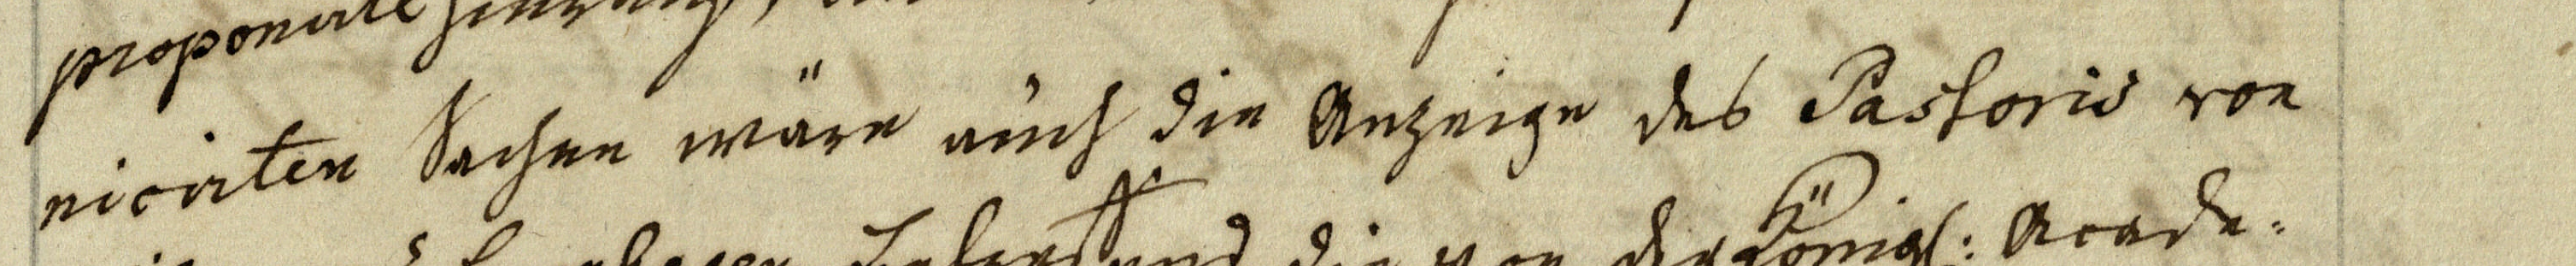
nicirten Sachen wäre auch die Anzeige des Pastoris von
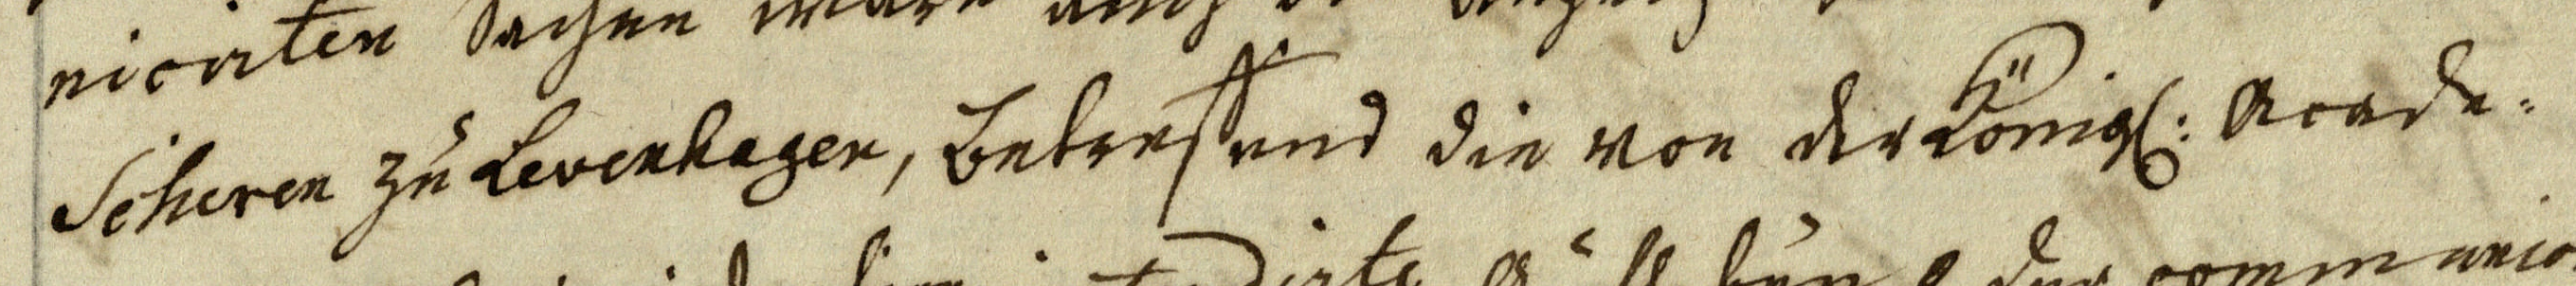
Scheven zu Levenhagen, betreffend die von der Königl. Acade¬
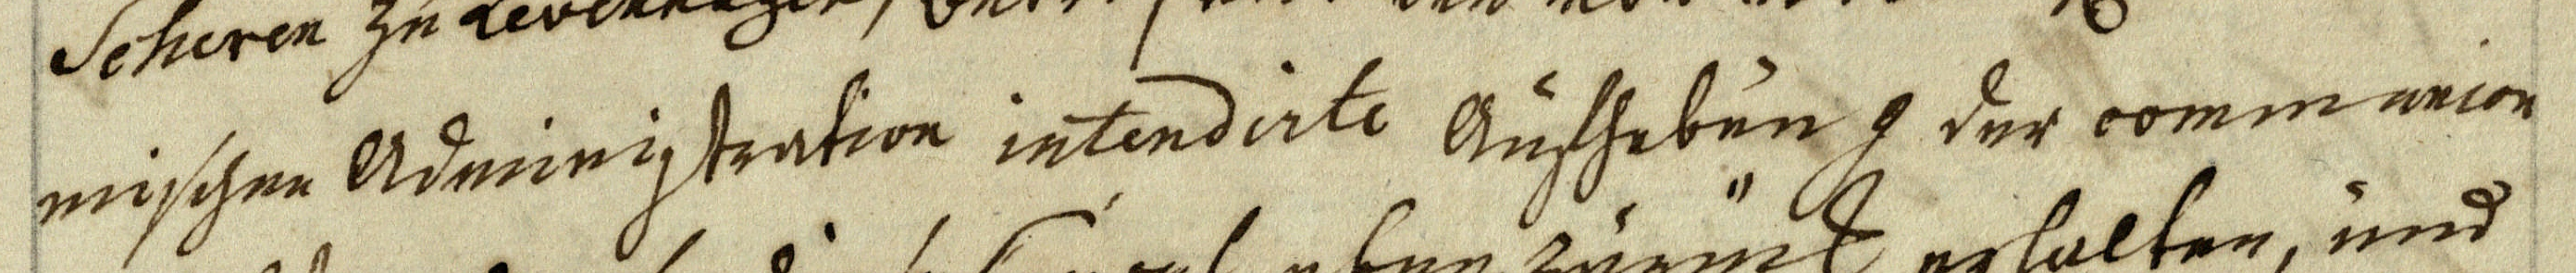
mischen Administration intendirte Aufhebung der communion
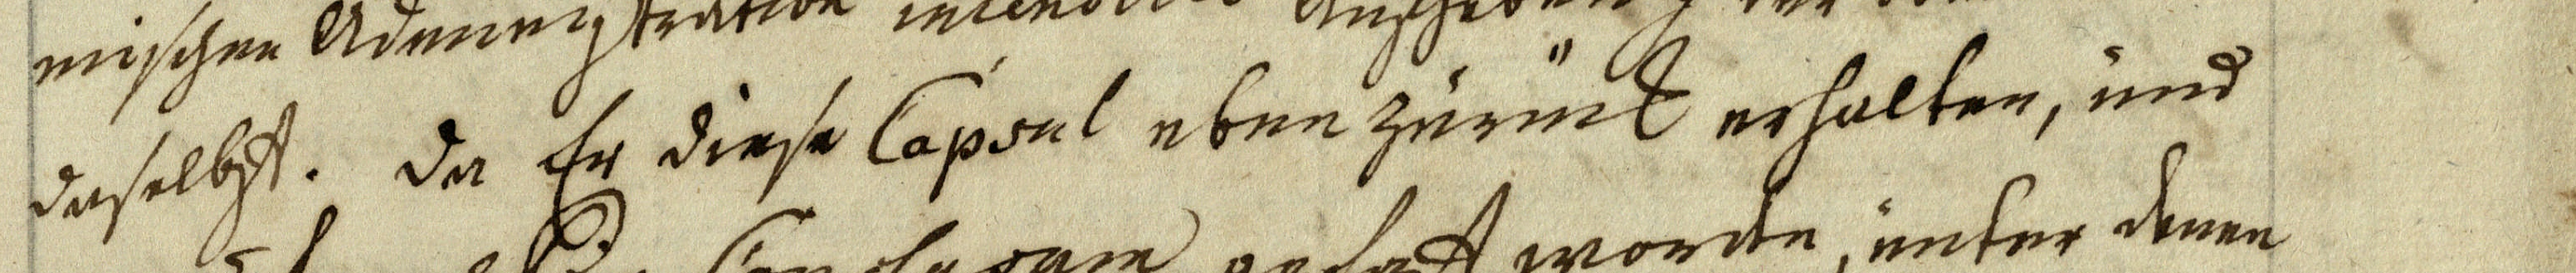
daselbst. da Er diese Capsul eben zurück erhalten, und
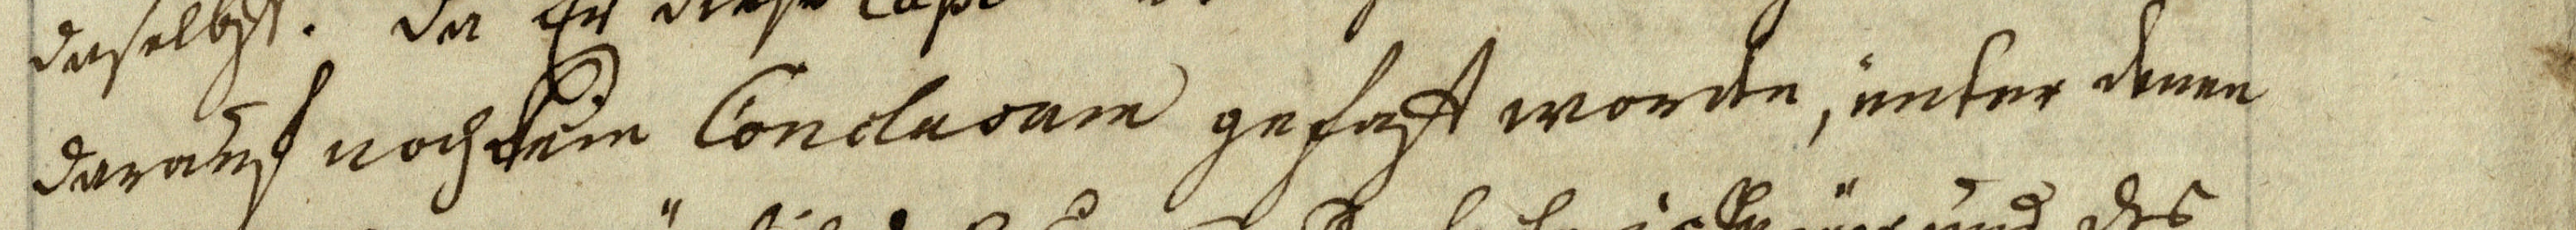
darauf noch kein Conclusum gefast worden, unter denen
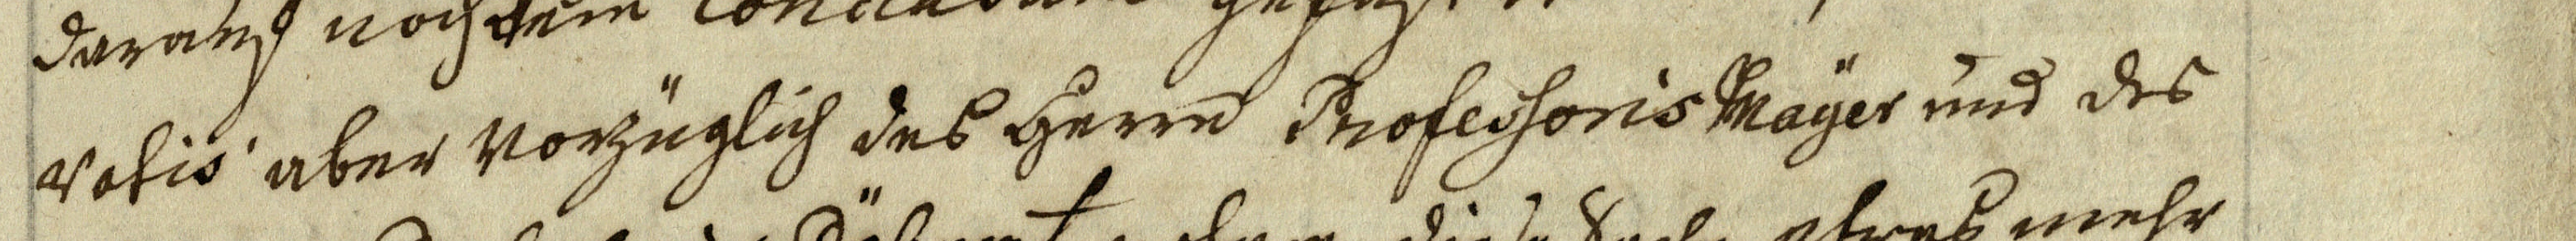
votis aber vorzüglich des Herrn Professoris Maÿer und des
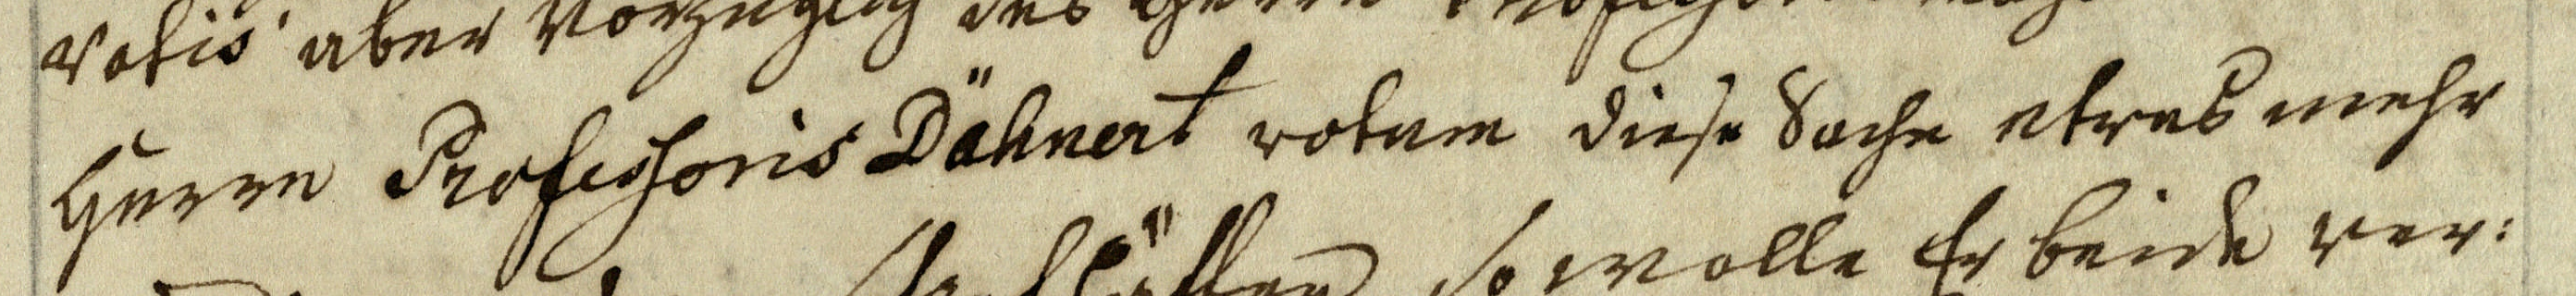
Herrn Professoris Dähnert votum diese Sache etwas mehr
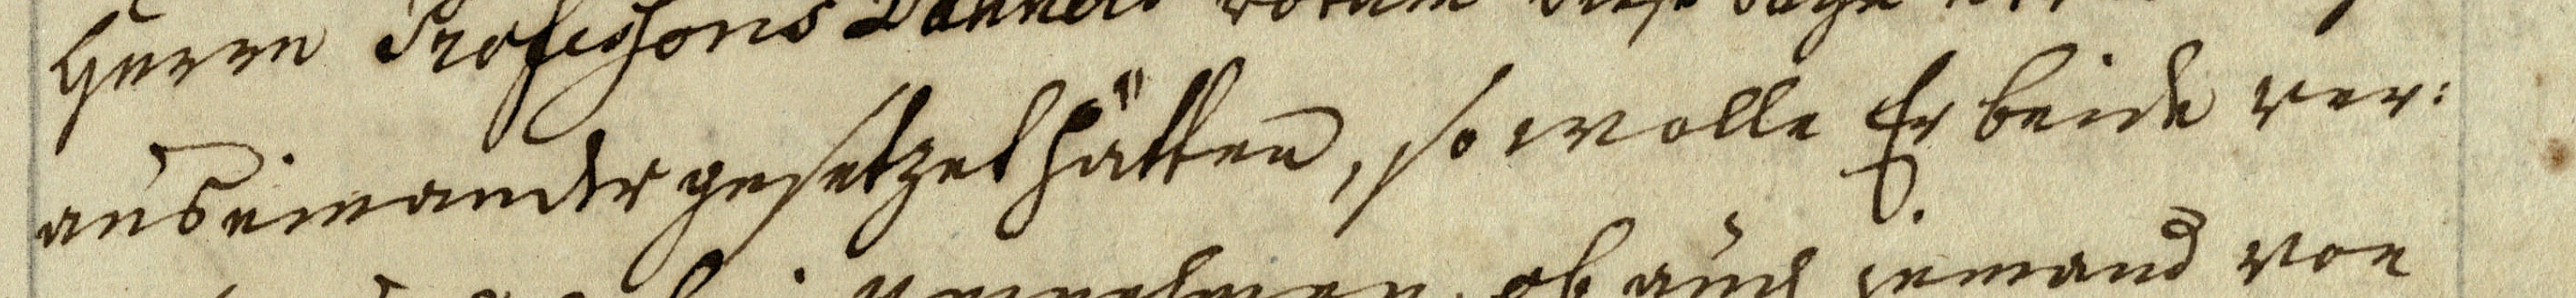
auseinandergesetzet hätten, so wolle Er beide ver¬
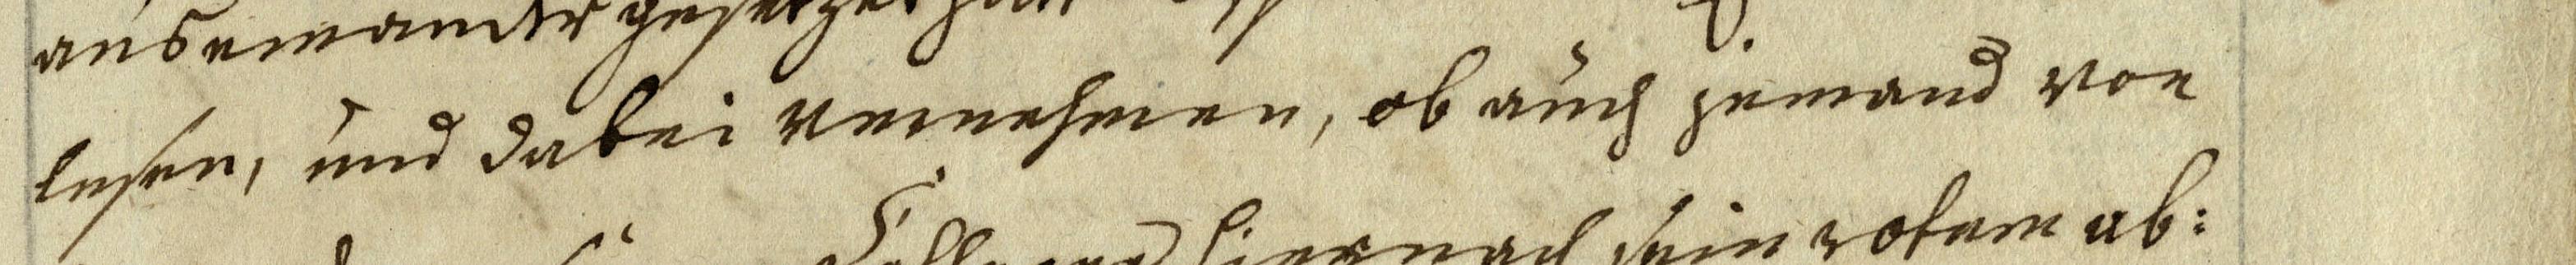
lesen, und dabei vernehmen, ob auch jemand von
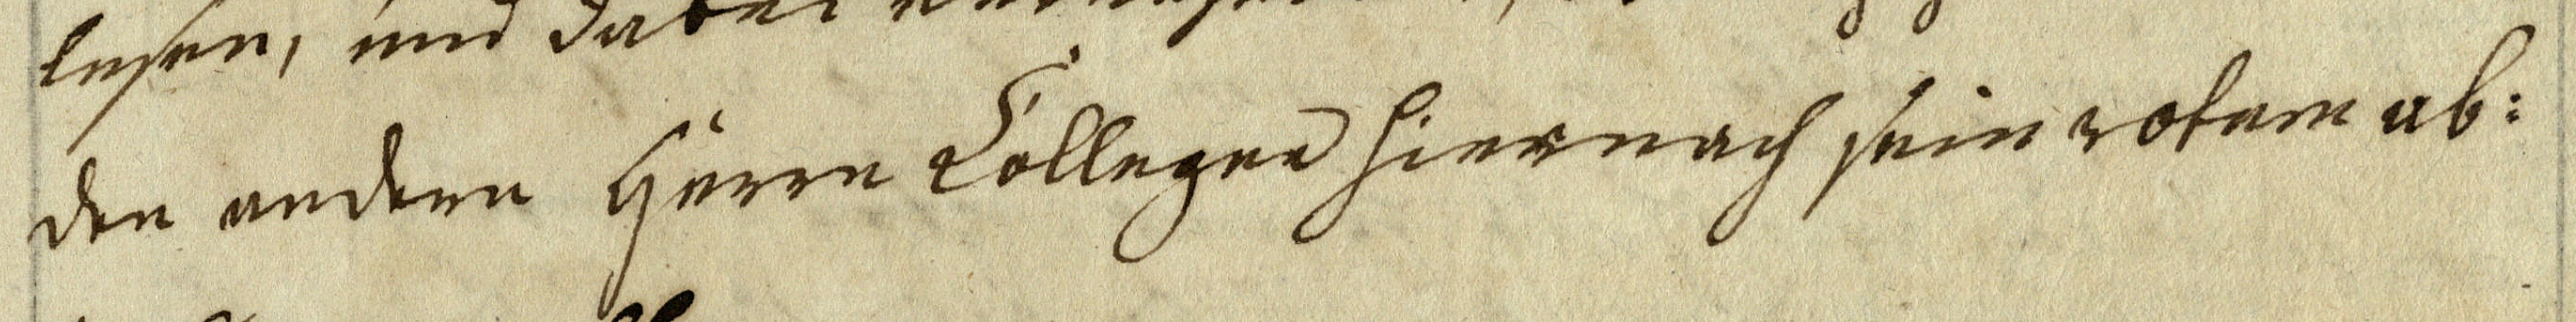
den andern Herrn Collegen hiernach sein votum ab¬
